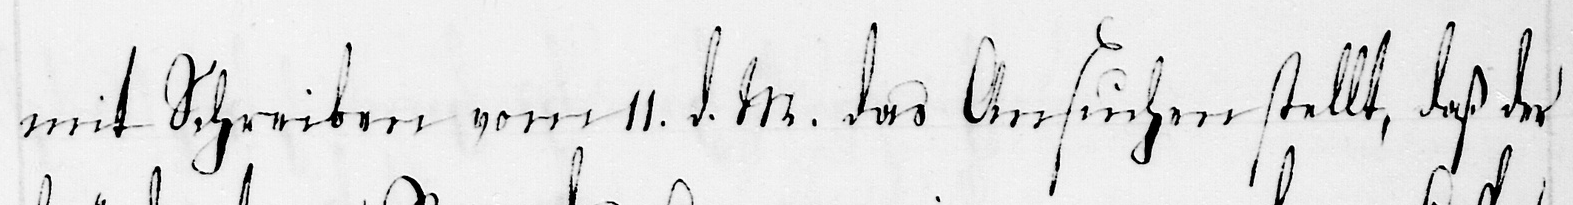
mit Schreiben vom 11. d. M. das Ansuchen stellt, daß der
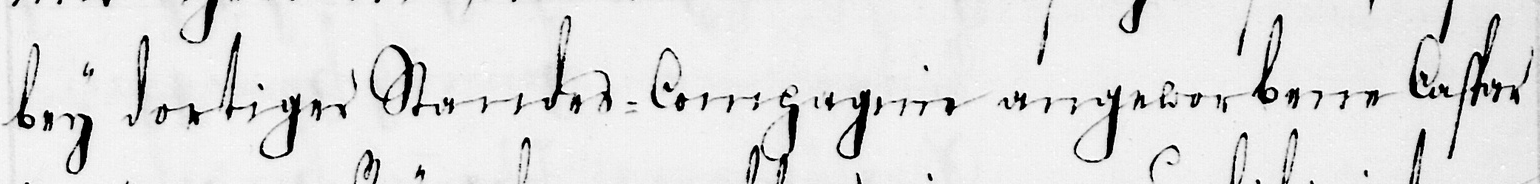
bey dortiger Standes-Compagnie angeworbene Caspar
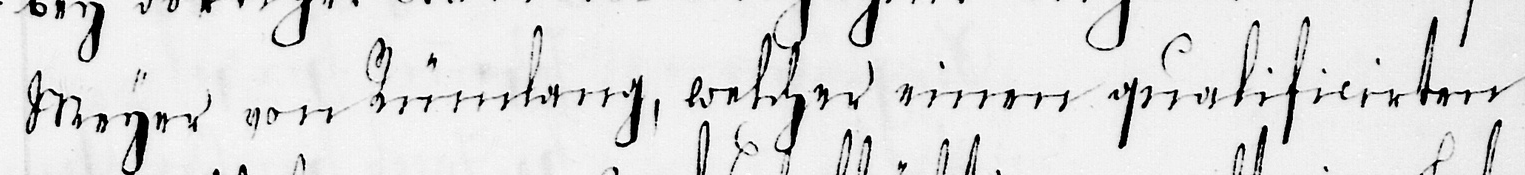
Meyer von Rümlang, welcher einen qualificirten
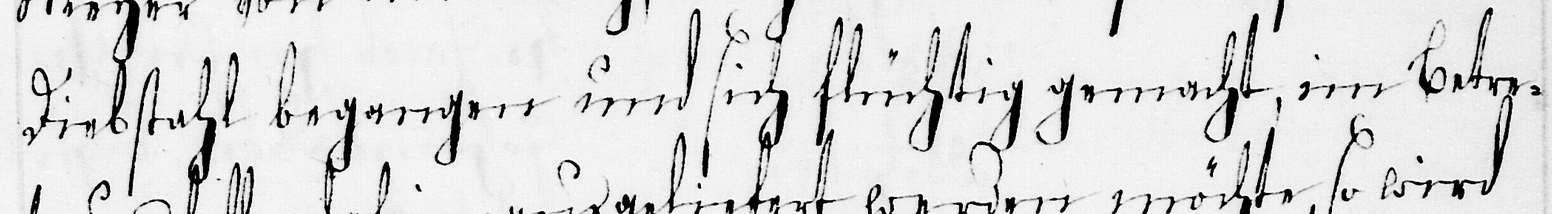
Diebstahl begangen und sich flüchtig gemacht, im Betre¬
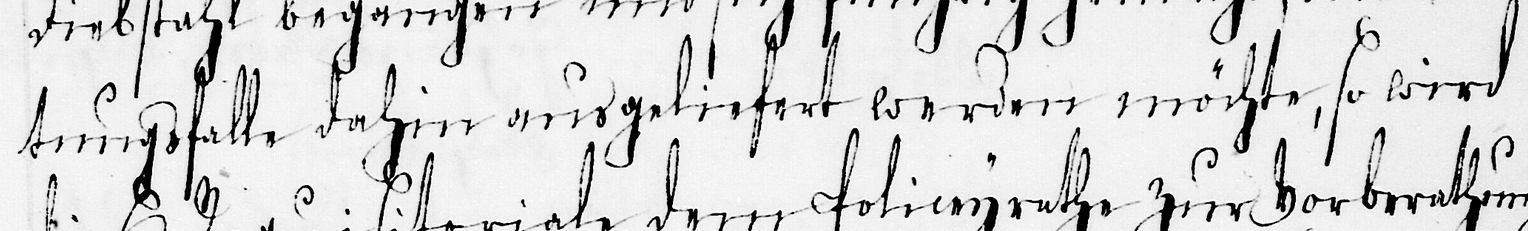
tungsfalle dahin ausgeliefert werden möchte, so wird
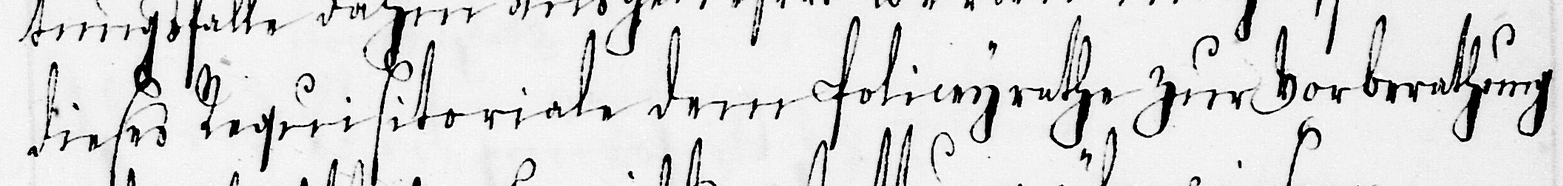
dieses Requisitoriale dem Policeyrathe zur Vorberathung
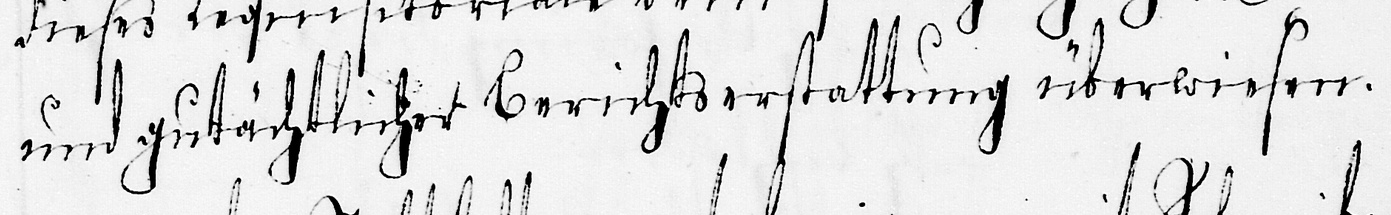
und gutächtlicher Berichtserstattung überwiesen.
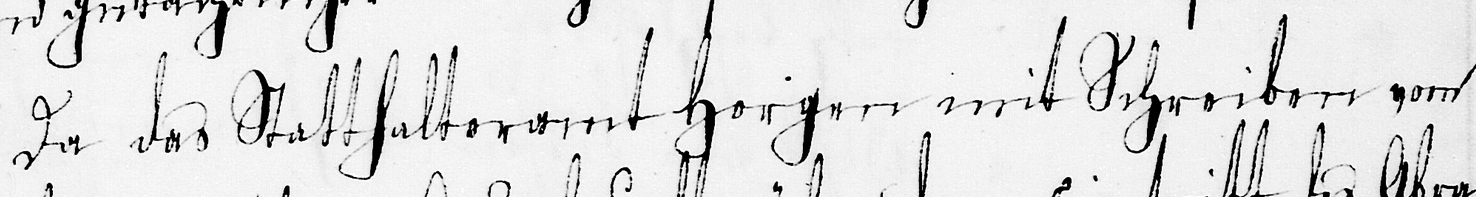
Da das Statthalteramt Horgen mit Schreiben vom
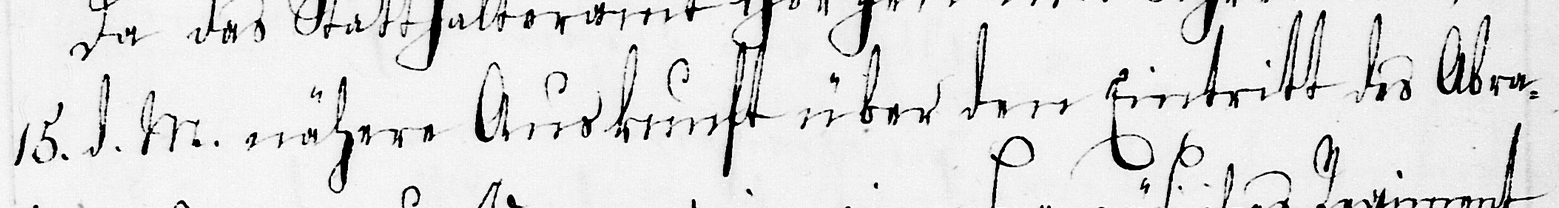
15. d. M. nähere Auskunft über den Eintritt des Abra¬
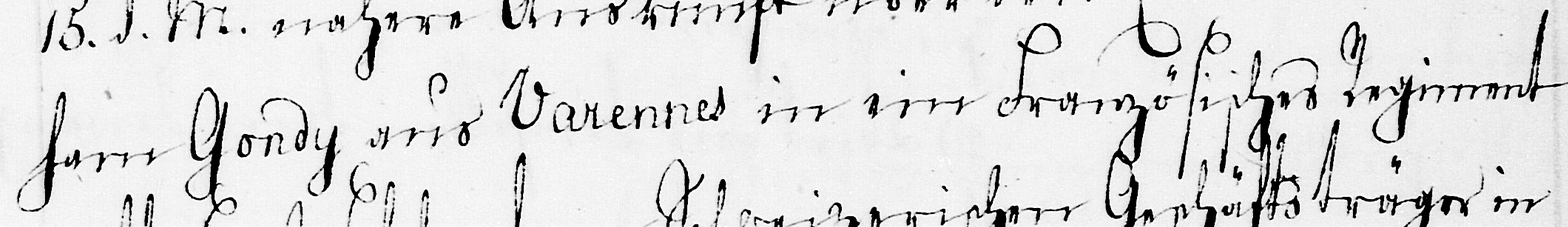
ham Gondy aus Varennes in ein Französisches Regiment
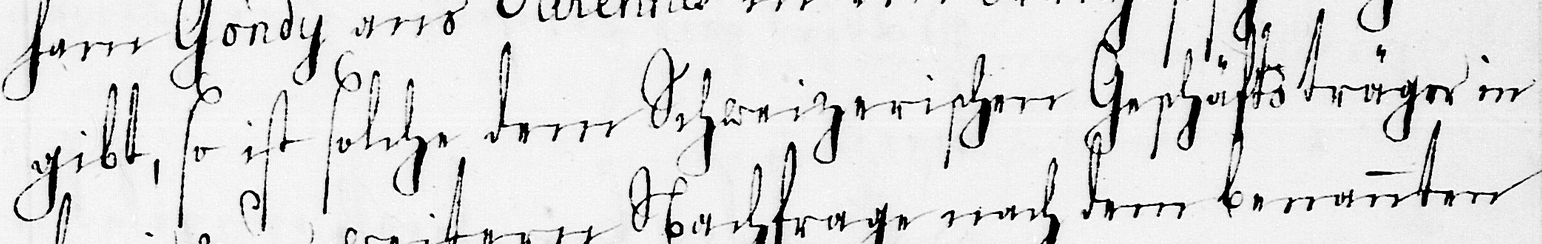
gibt, so ist solche dem Schweizerischen Geschäftsträger in
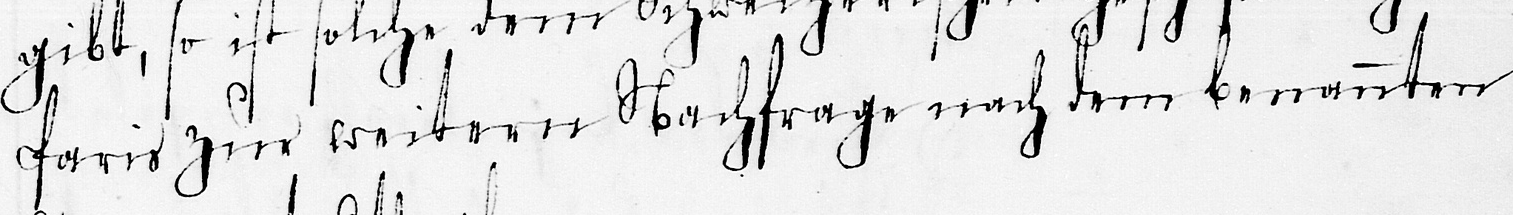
Paris zur weitern Nachfrage nach dem benannten
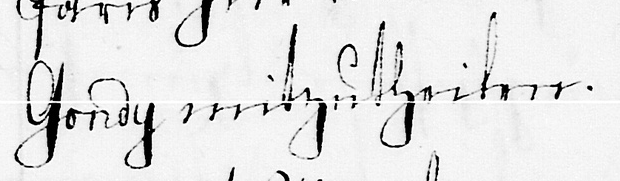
Gondy mitzutheilen.
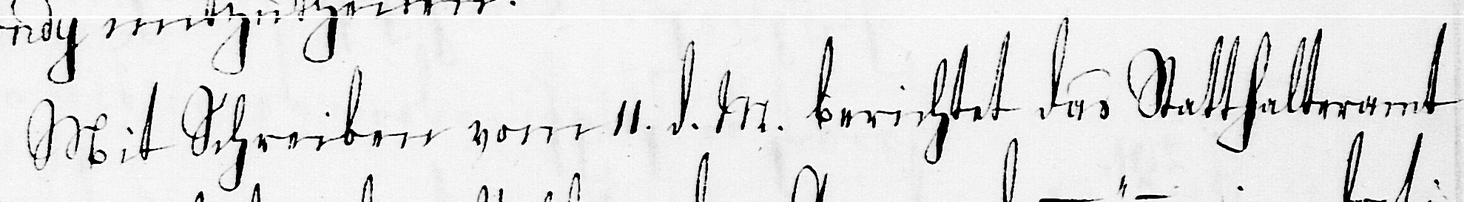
Mit Schreiben vom 11. d. M. berichtet das Statthalteramt
